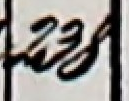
238
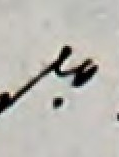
do
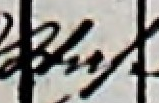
Was„
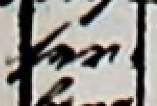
ser„
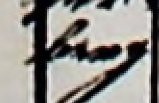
berg
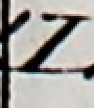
I
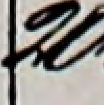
20
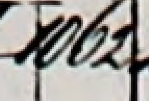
1062
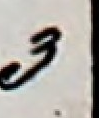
3
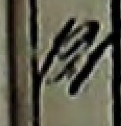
121
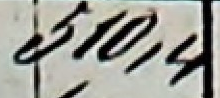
510,4
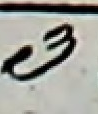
3
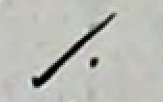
./.
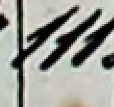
111
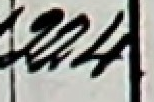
224
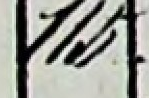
115
